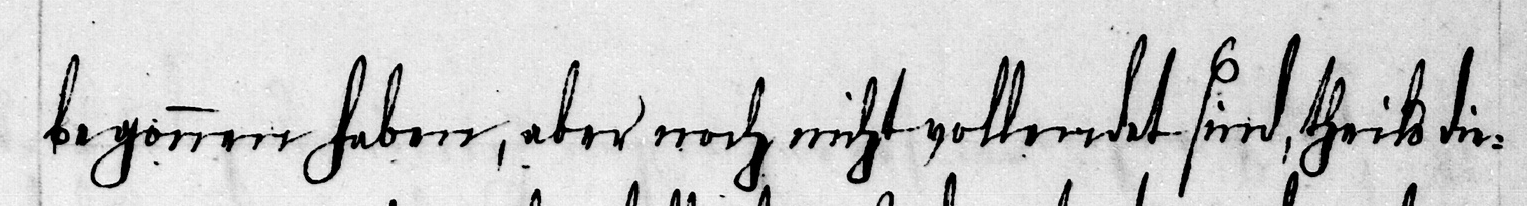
begonnen haben, aber noch nicht vollendet sind, theils
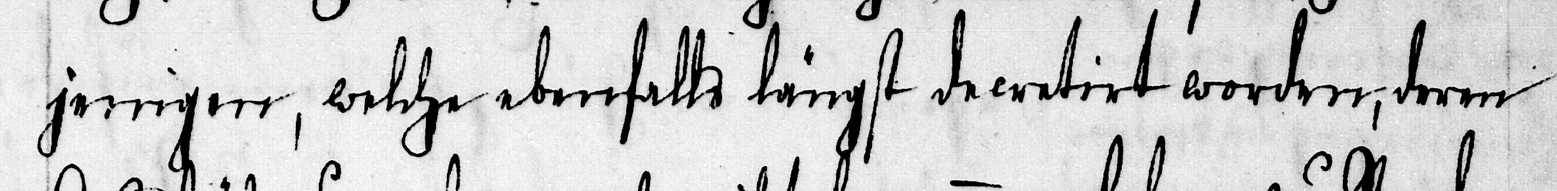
jenigen, welche ebenfalls längst decretirt worden, deren
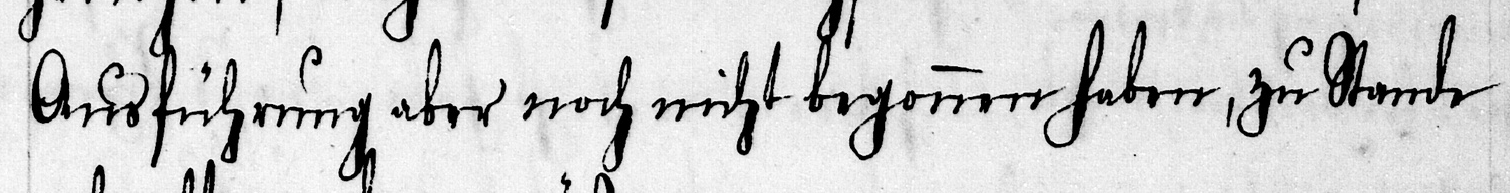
Ausführung aber noch nicht begonnen haben, zu Stande
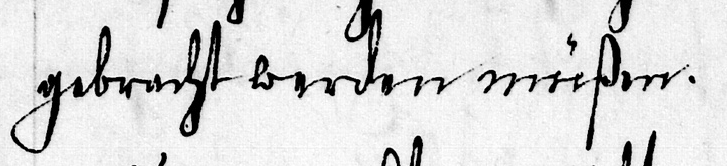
gebracht werden müßen.
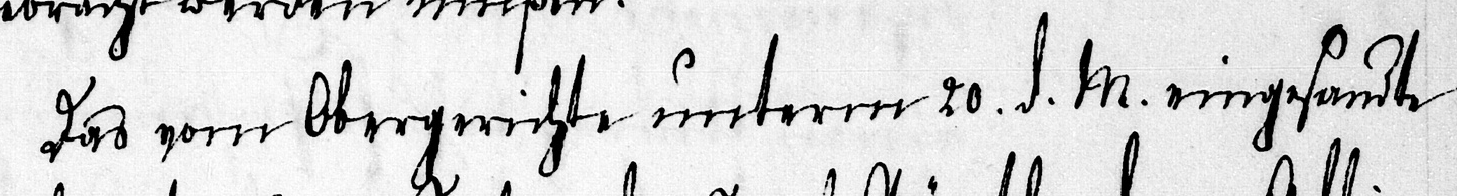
Das vom Obergerichte unterm 20. d. M. eingesandte
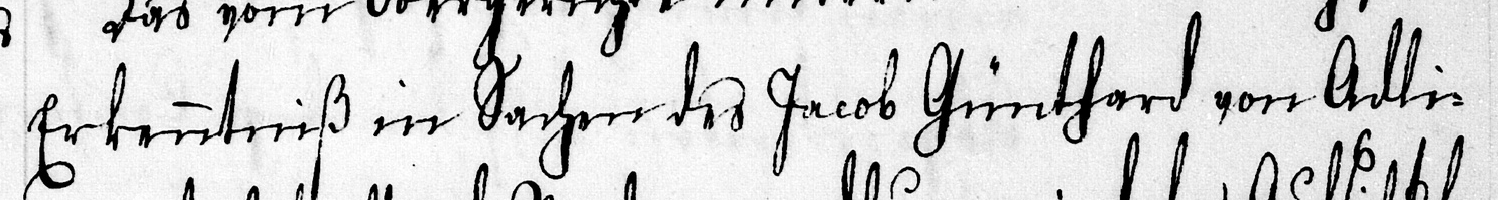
Erkenntniß in Sachen des Jacob Günthard von Adlis¬
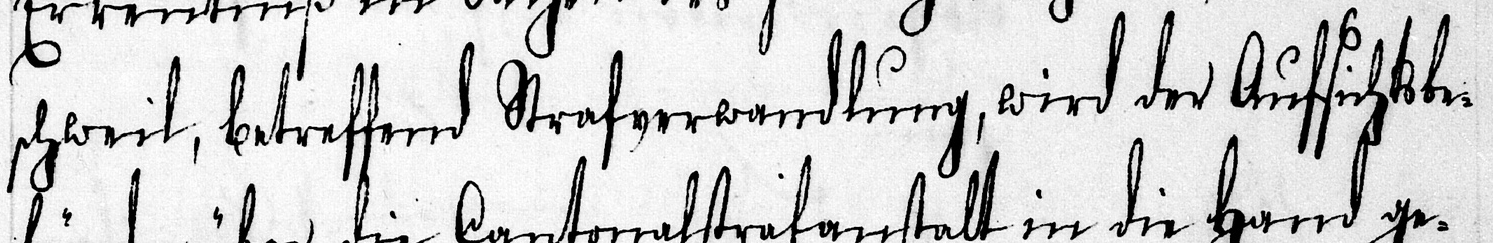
chweil, betreffend Strafverwandlung, wird der Aufsichtsb¬
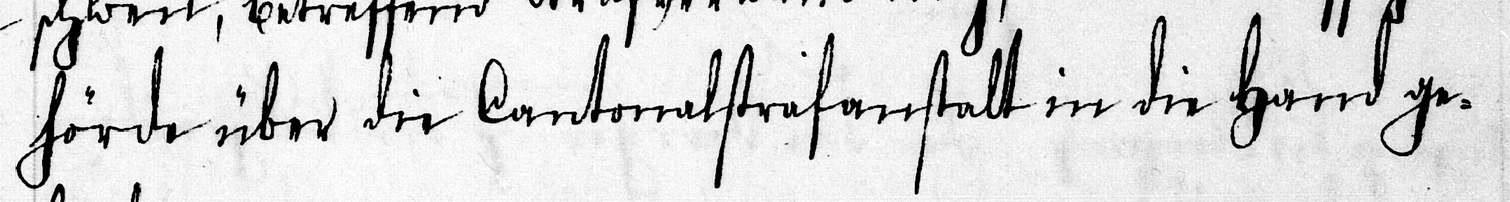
ehörde über die Cantonalstrafanstalt in die Hand ge¬
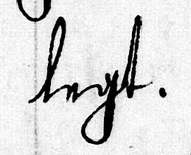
legt.
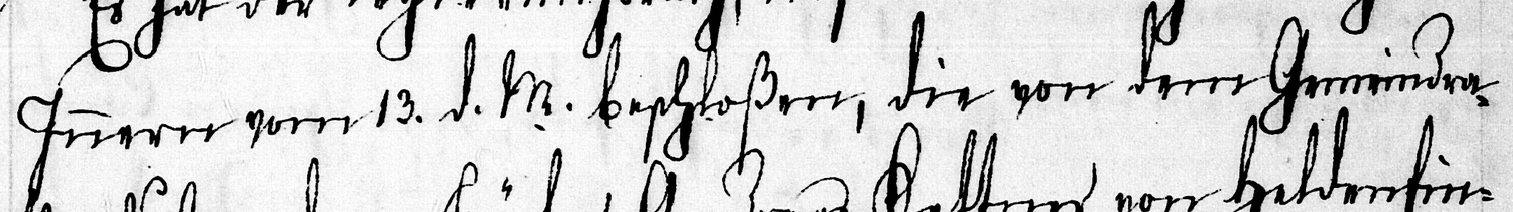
Innern vom 13. d. M. beschloßen, die von dem Gemeindra¬
